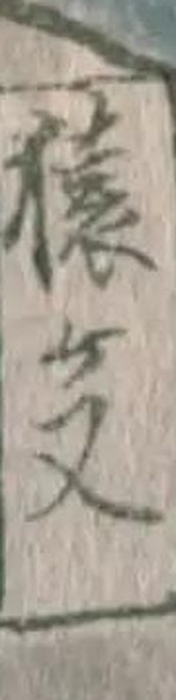猿ヶ又
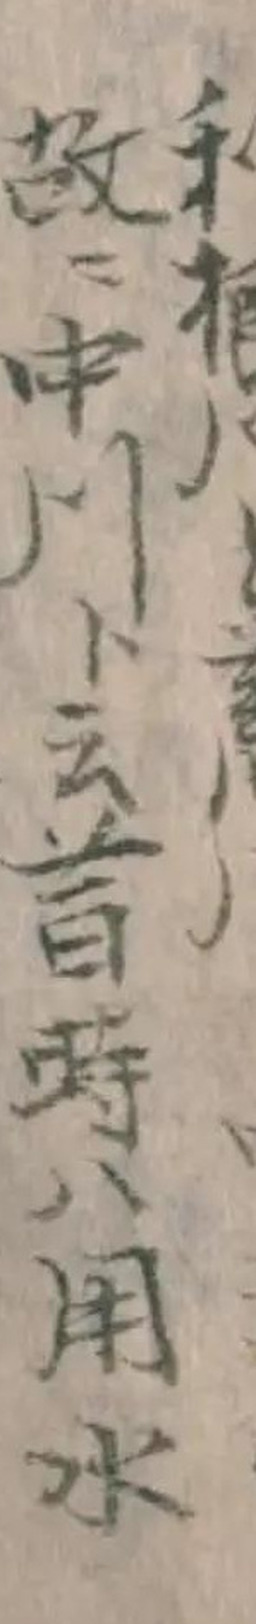故ニ中川ト云昔時ハ用水
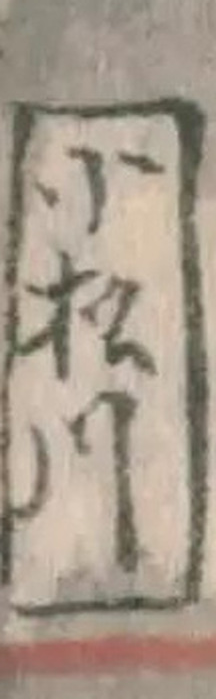小松川
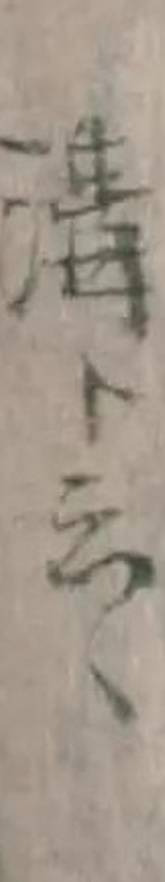溝ト云々
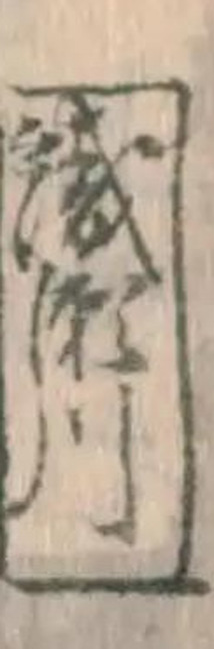綾瀬川
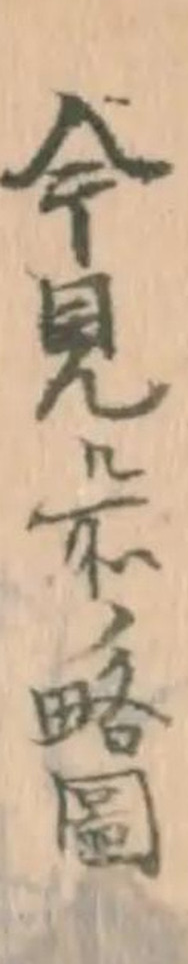今見ル所ノ略図
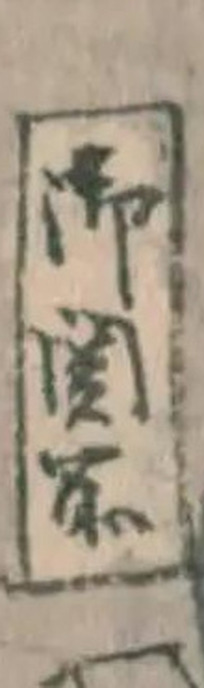御関所
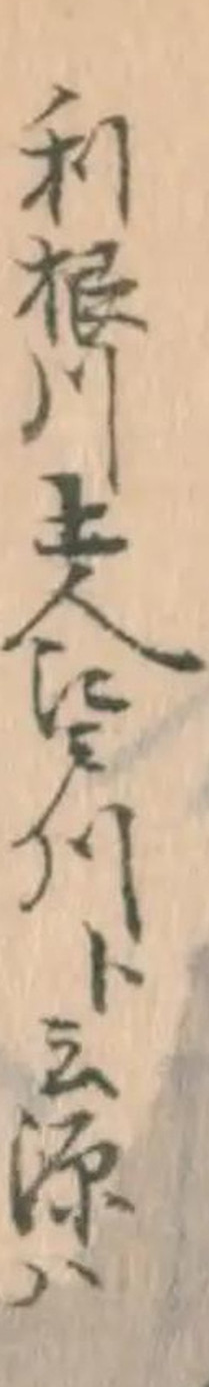利根川土人江戸川ト云源ハ
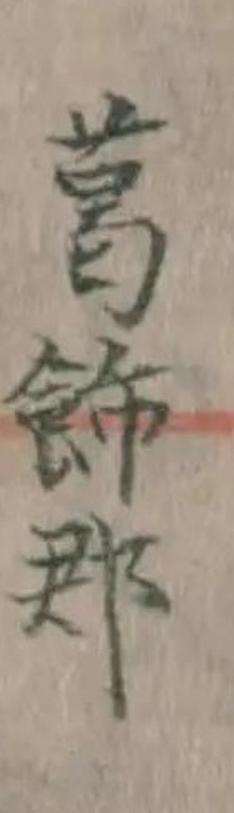葛飾郡
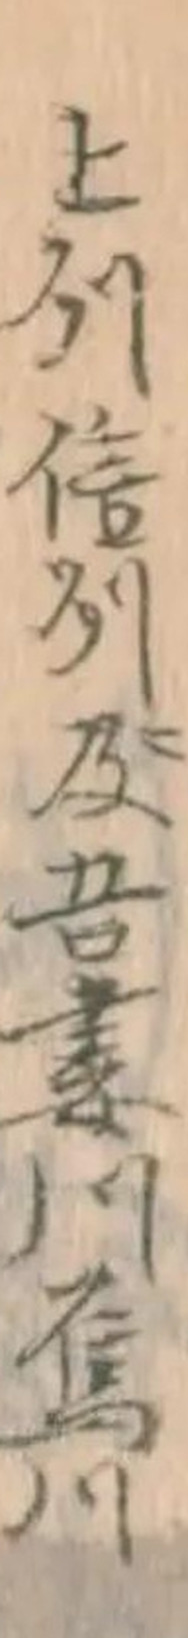上州信州ニ及吾妻川烏川
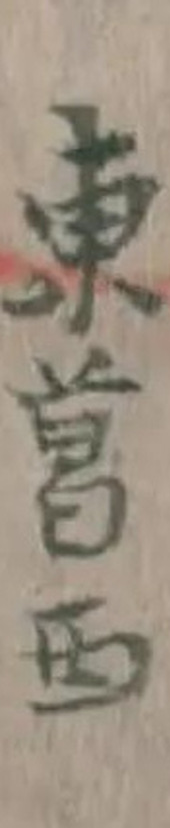東葛西
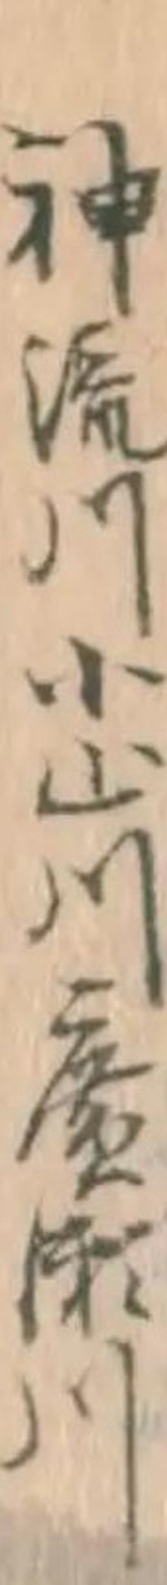神流川小山川広瀬川
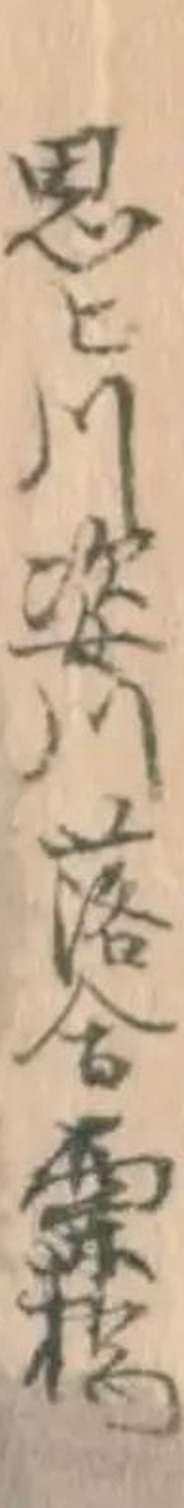思ヒ川姿川落合栗橋
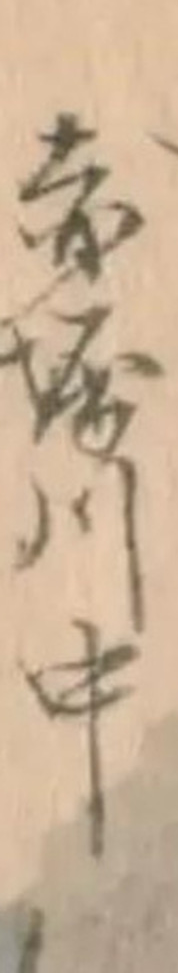赤堀川中
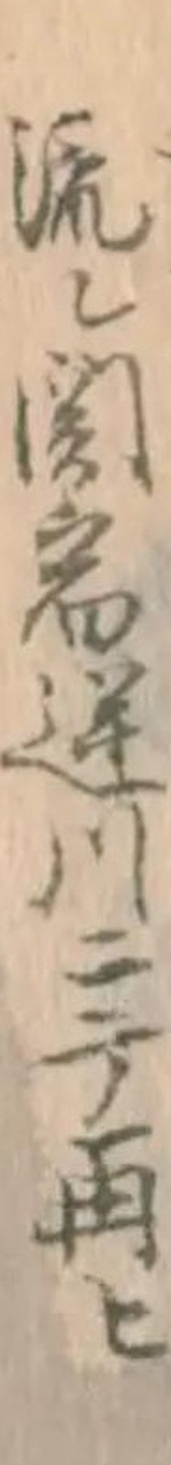流レ関宿逆川ニテ再ヒ
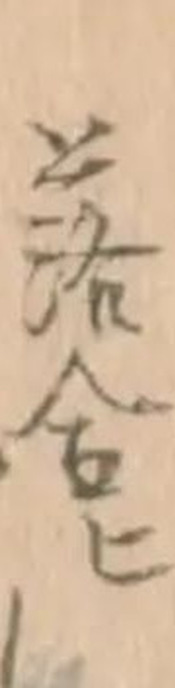落合ヒ
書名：四神地名録 6巻. [4]葛飾郡
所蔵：国立国会図書館 National Diet Library, JAPAN
